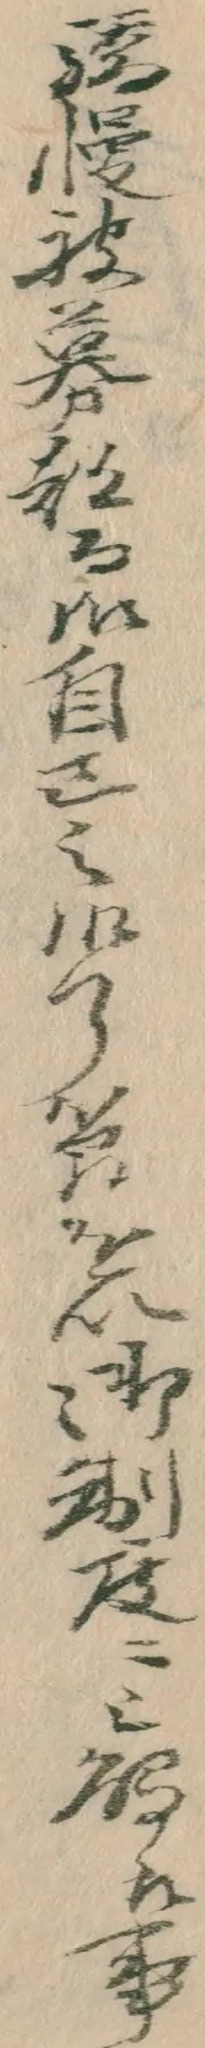驕慢披募難而御自己之御了簡を以御制度ニ被觸候事
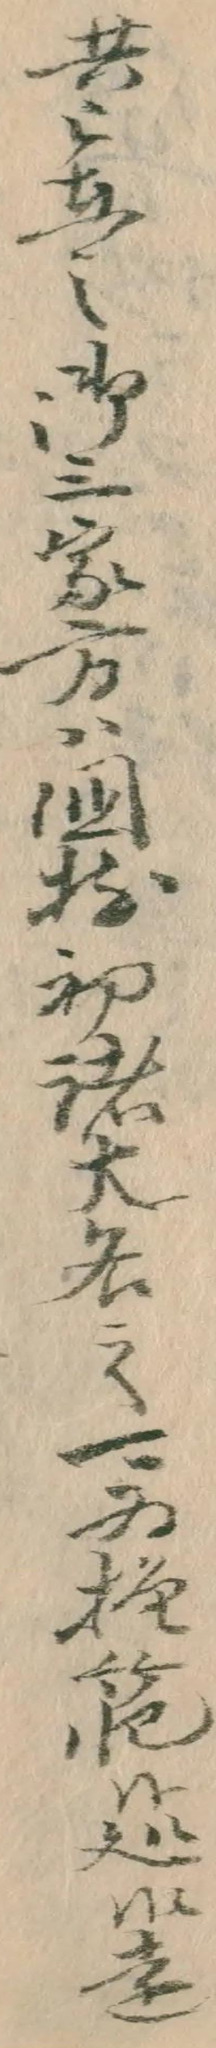共被在之御三家方ハ国持初諸大名之可為権範候処御遠
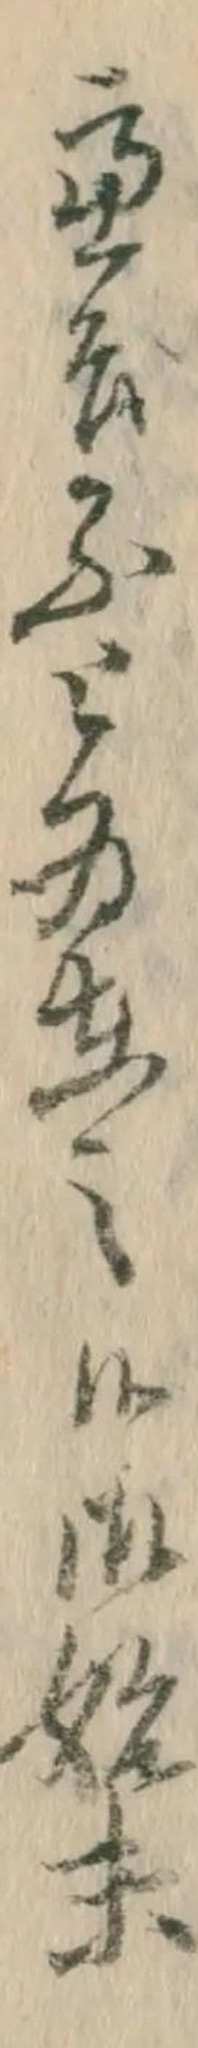慮も不被為在之候御始末
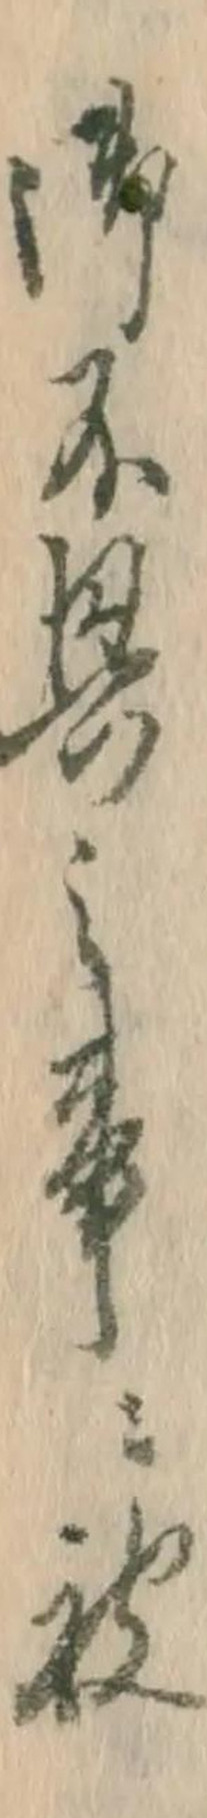御不興之事ニ被

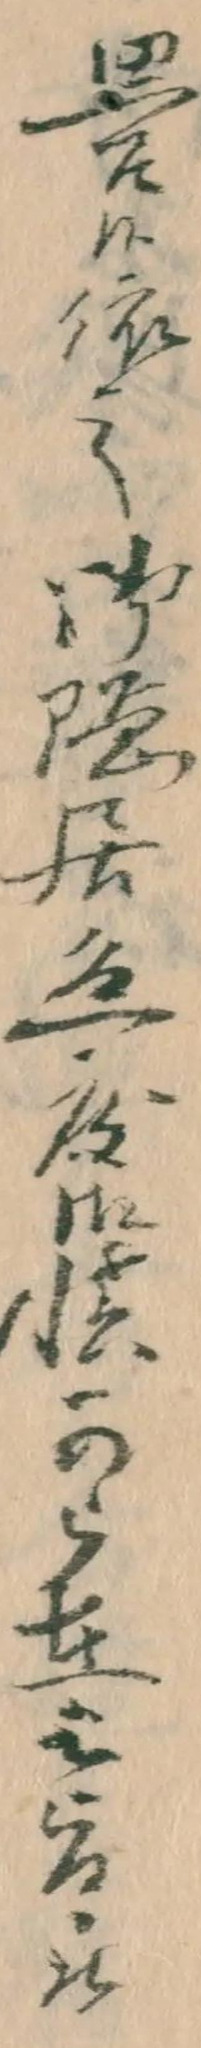思召候依之御隠居急度御慎可被在之旨被
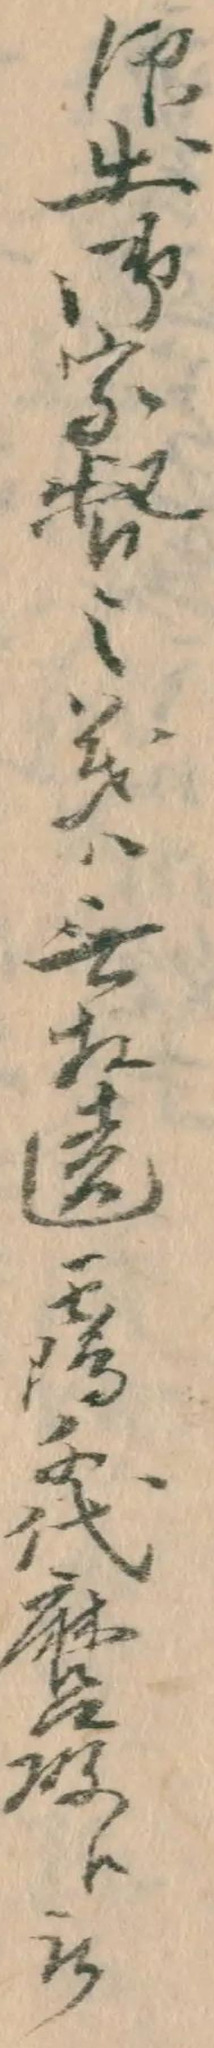仰出御家督之義ハ無相違鶴千代麿殿え被
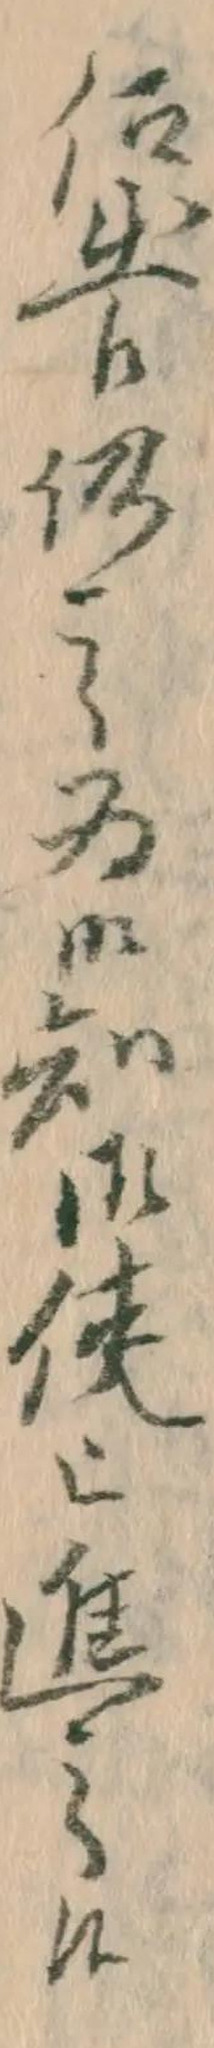仰出候仍之為御知御使被進之候
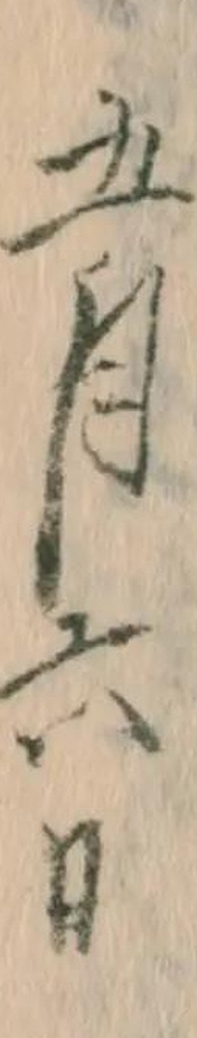五月六日
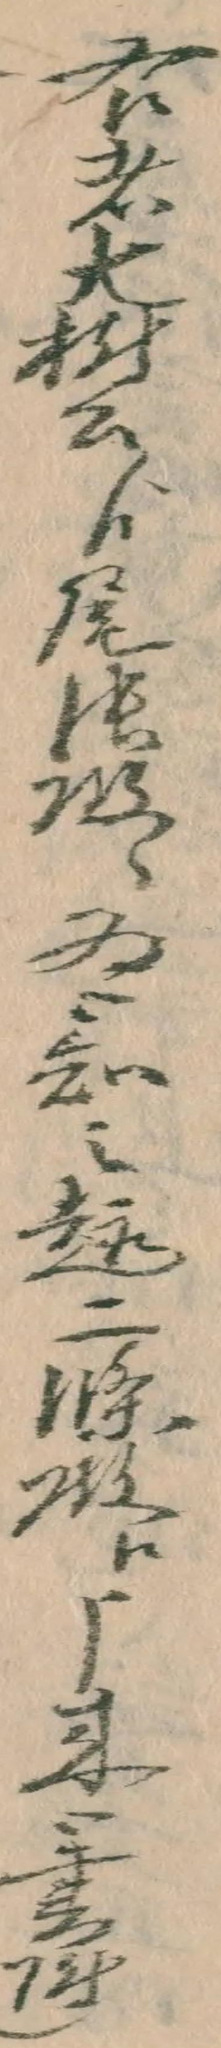右は大樹公ゟ尾張殿へ為御知之趣二條殿江申来御書附也
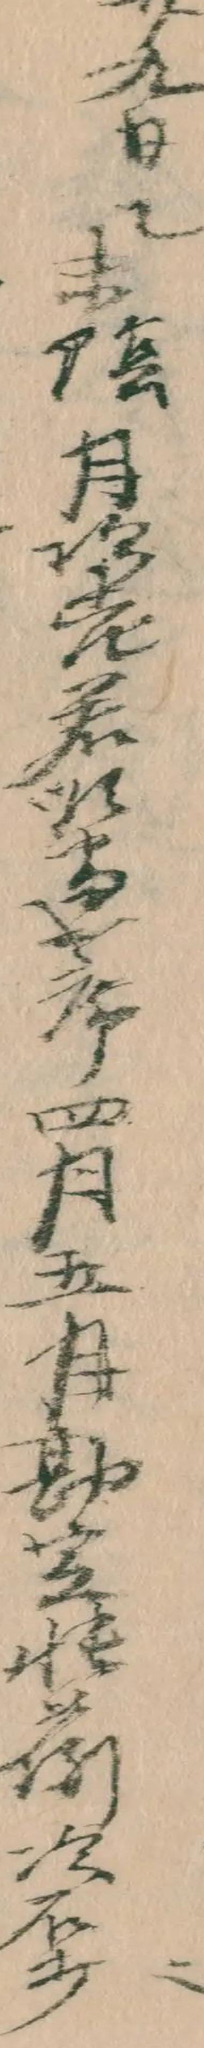廿九日乙未陰月次老若順番出席四月五月勘定帳如例次石打
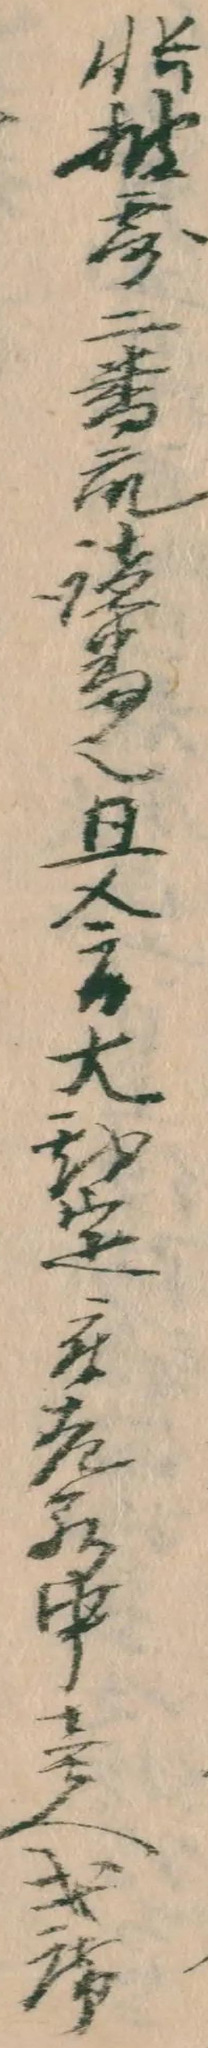帳披露二番衆讀番也且今日大勘定ニ付老若中壱人出席
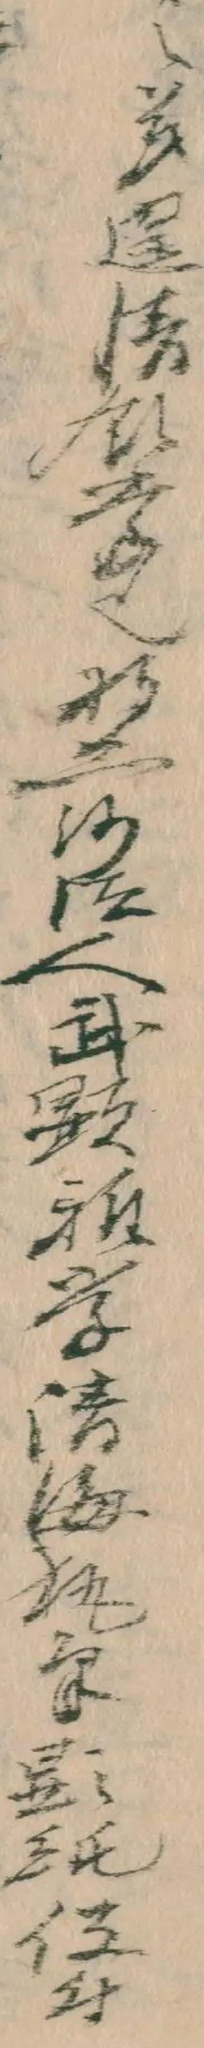之義逞清領掌也将又沙汰人武顕祈季清海執筆顕純役付
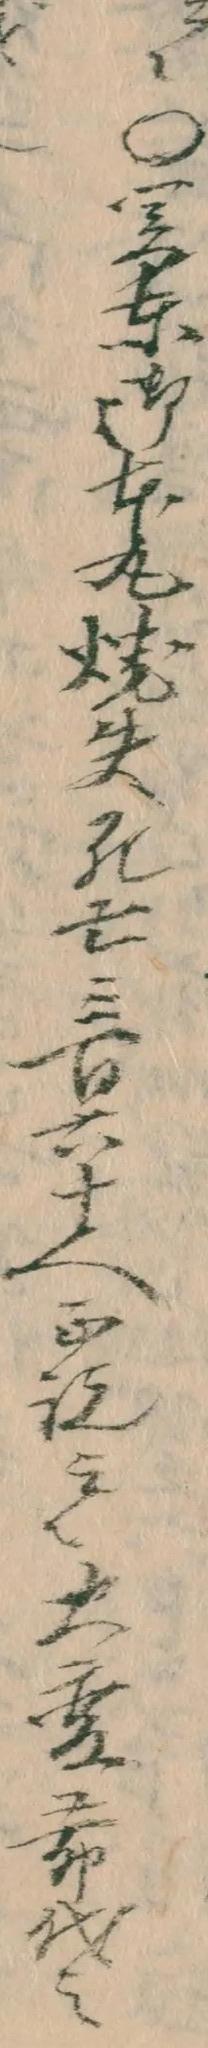云々○関東御本丸焼失死亡三百六十人正説云々大変希代之
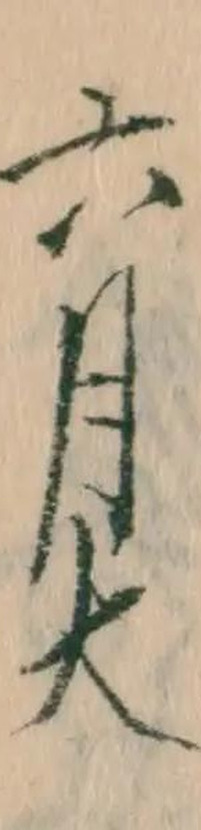六月大
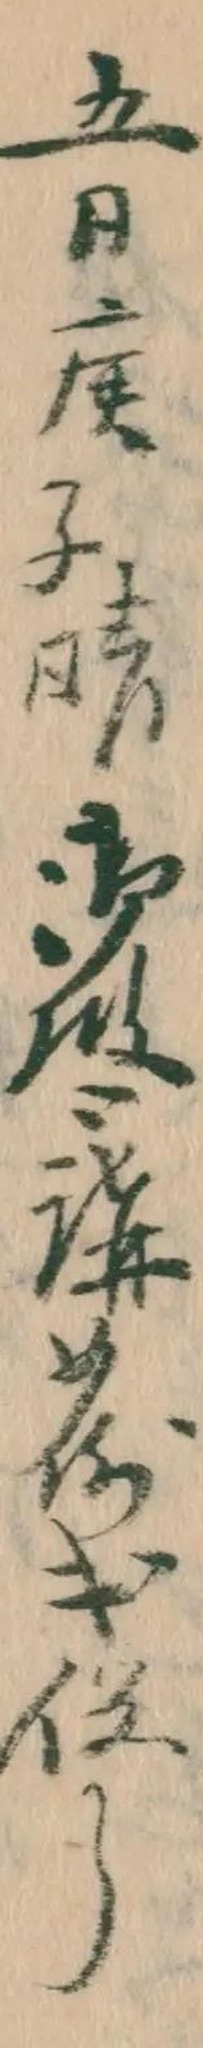五日庚子晴御殿御講如例出役了
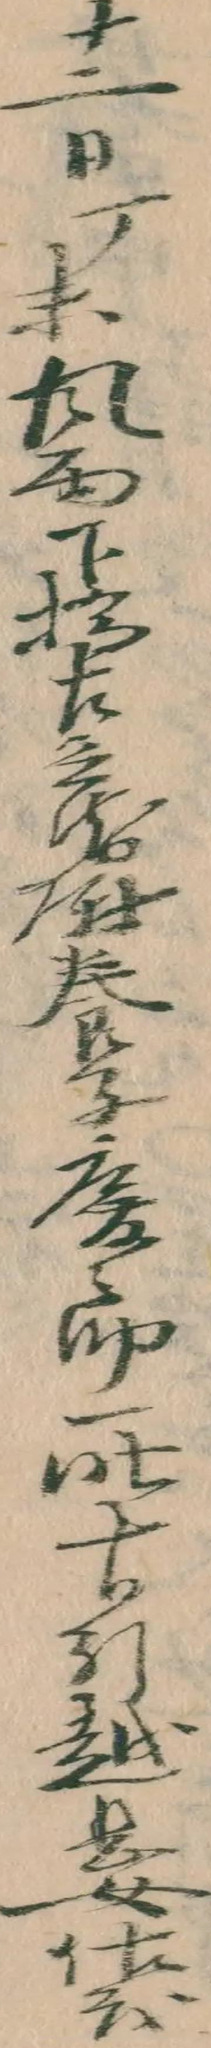十二日丁未風雨下橋左衛衛附養子慶之助一昨十日引越息女さも
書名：賀茂社記録. 第69冊
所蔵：国立国会図書館 National Diet Library, JAPAN
